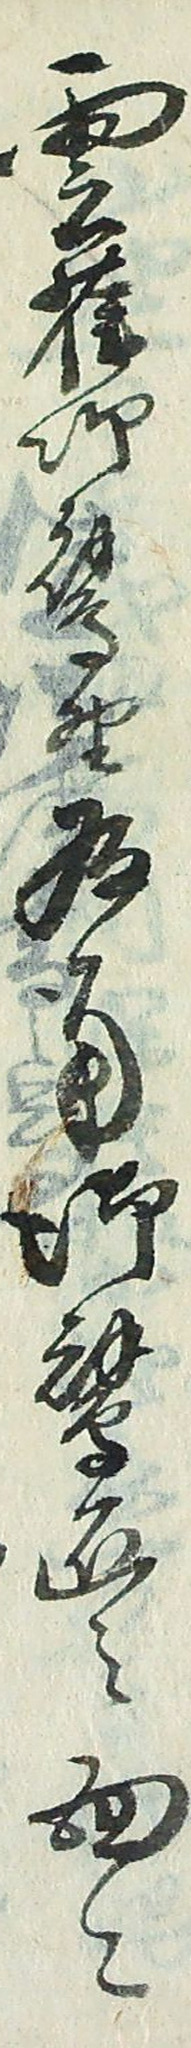雲雀御鷹野為御用御鷹匠之面々
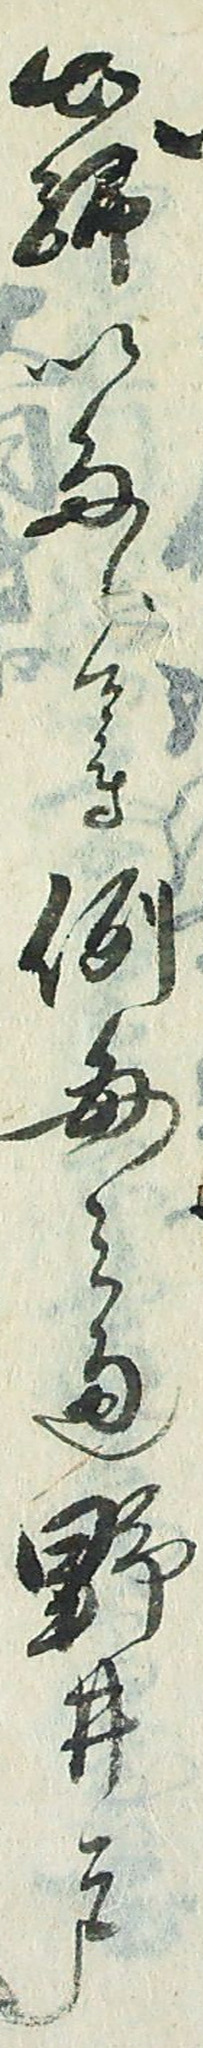出郷いたし候に付例毎之通野井戸
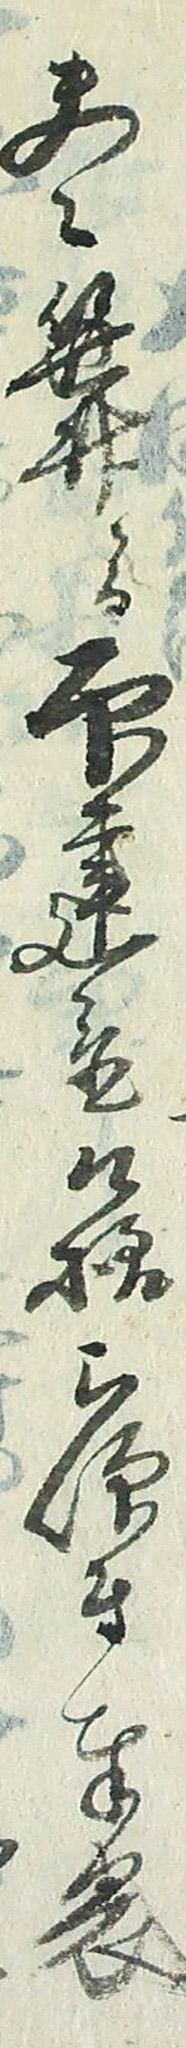夫々笹竹に而印建置候様被仰付奉畏
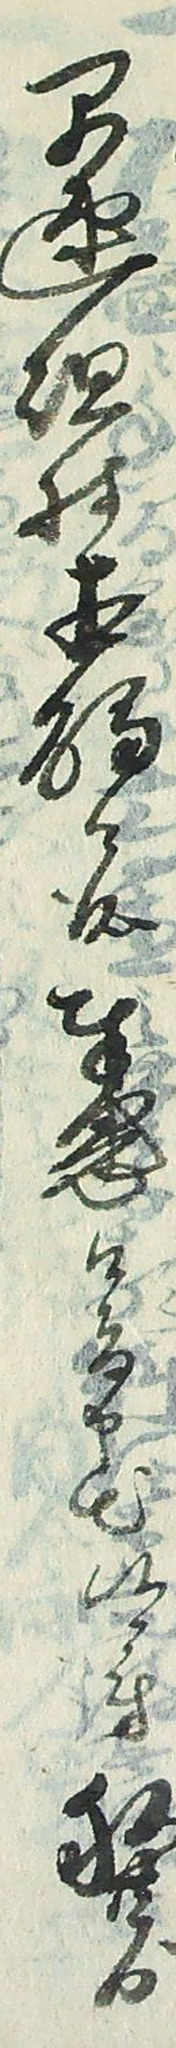早速組村相触候所奉畏候旨申出候に付私共ゟ
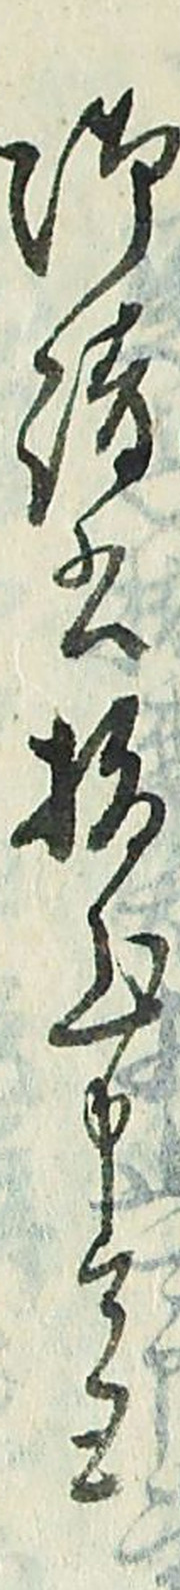御請書指上申候以上
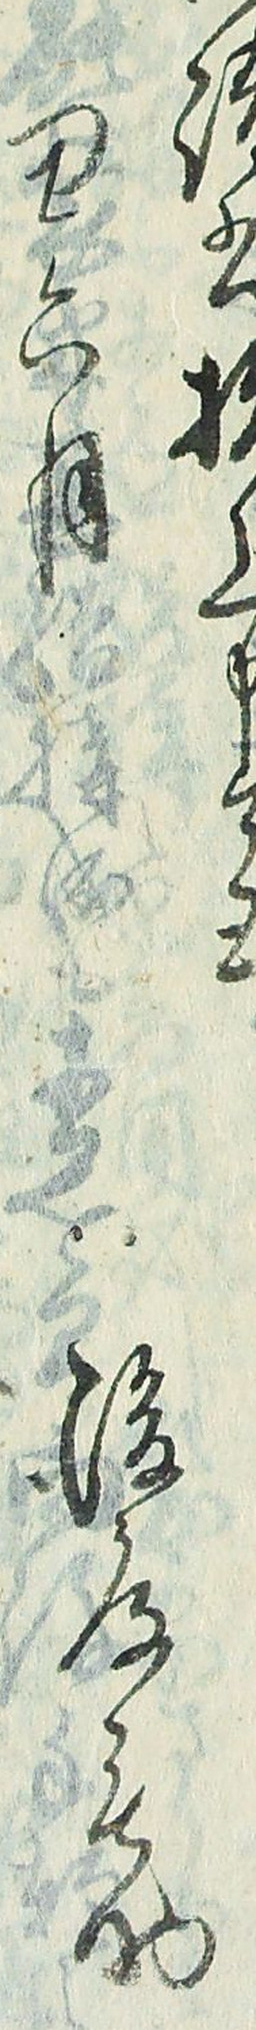丑六月後藤庄助
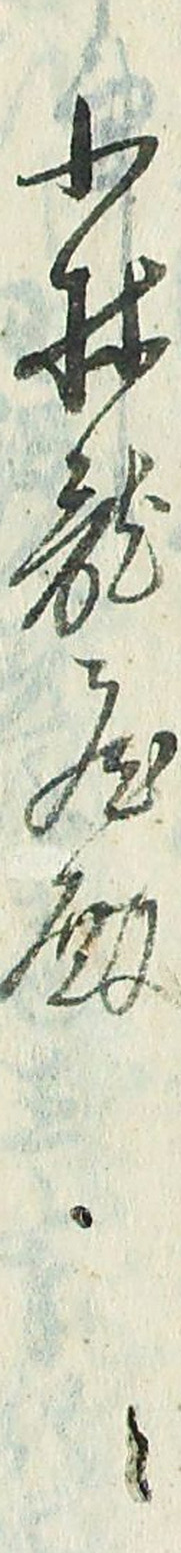小林龍蔵殿
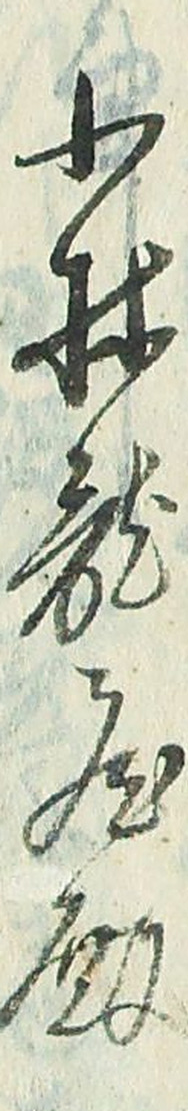小林龍蔵殿

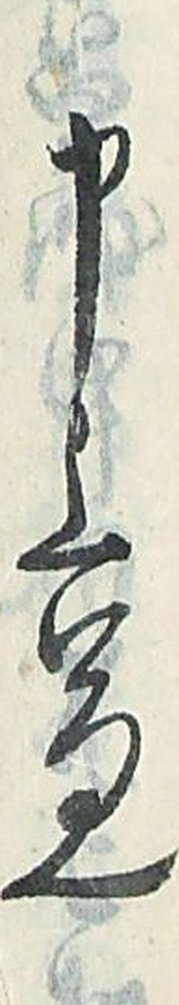申上覚
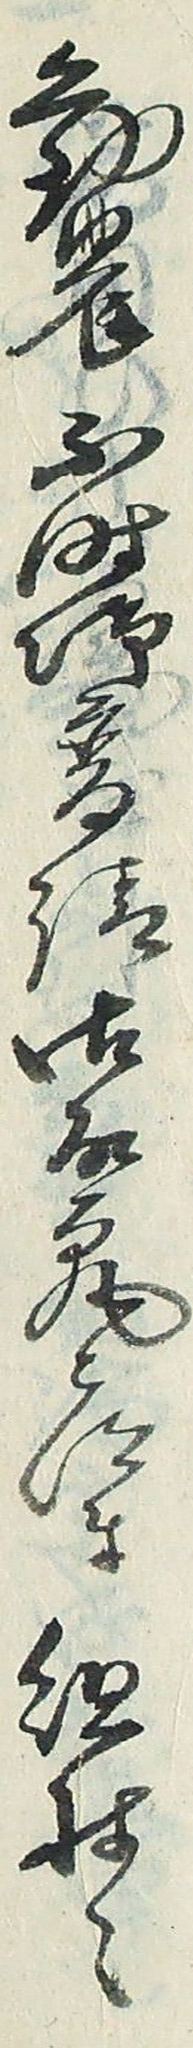勧農不時御普請請御取究被仰付組村々
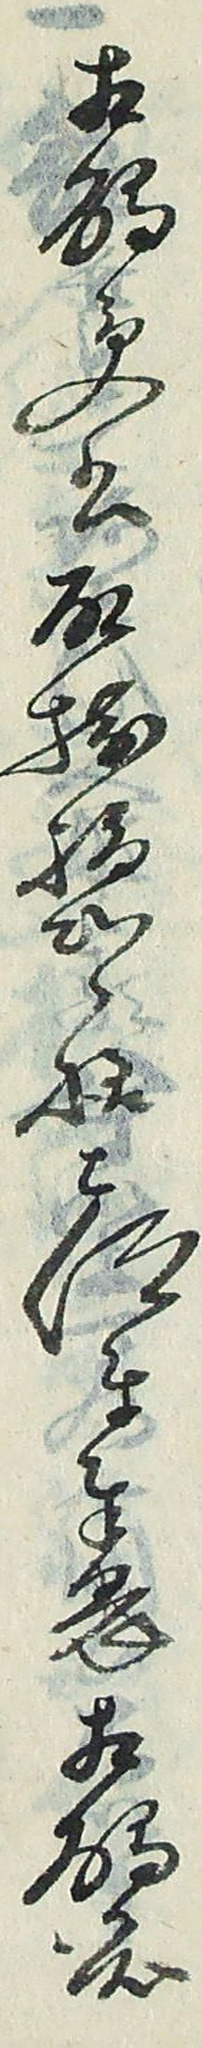相触受書取揃指出候様被仰付奉畏相触候所
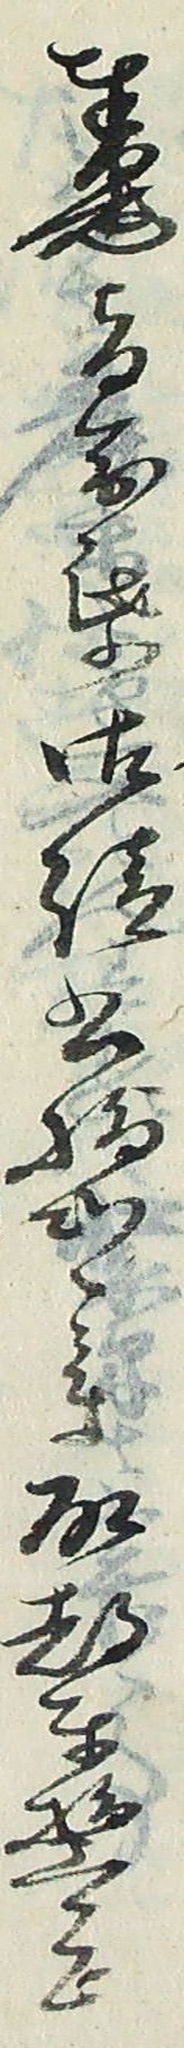奉畏旨別紙御請書指出候に付取都奉指上候以上
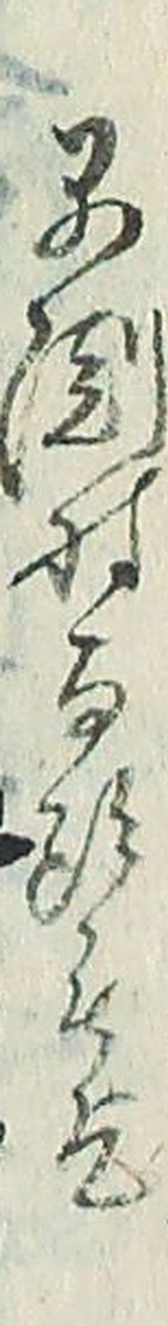早淵村与頭庄屋
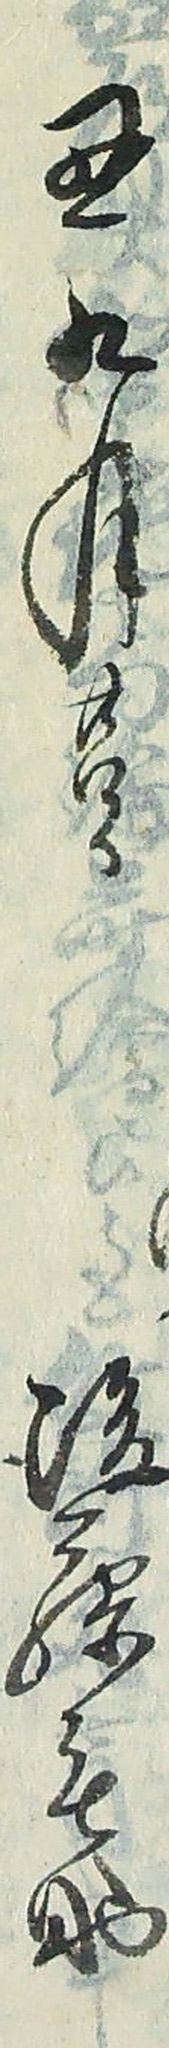丑九月廿四日後藤庄助
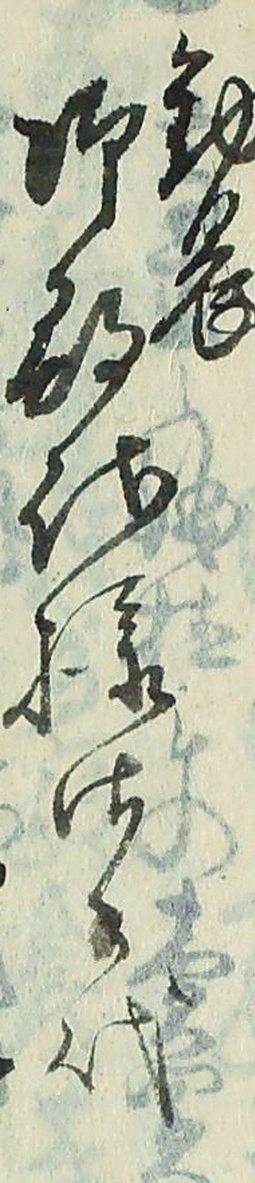御郡代様御手代
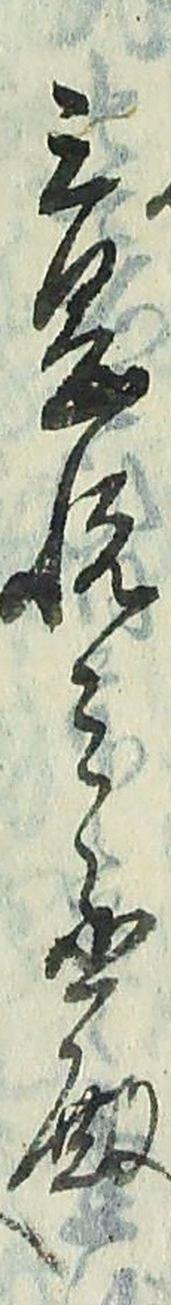三岡悦之丞殿
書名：諸御用御□受書控
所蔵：鳴門教育大学 Naruto University of Education
